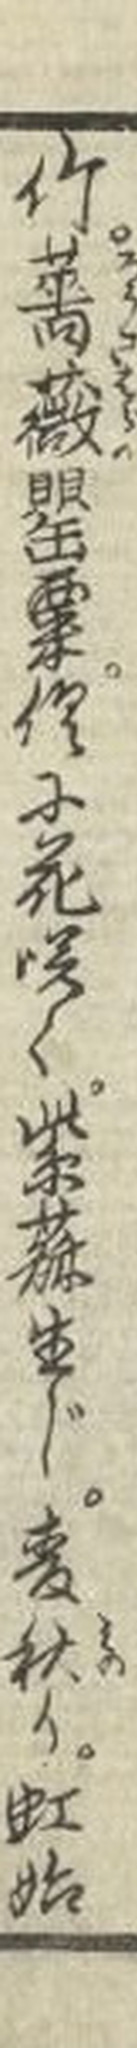竹。薔薇罌粟。俱に花咲く。紫蘇生じ。麦秋り。虹始
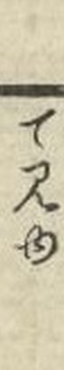て見ゆ
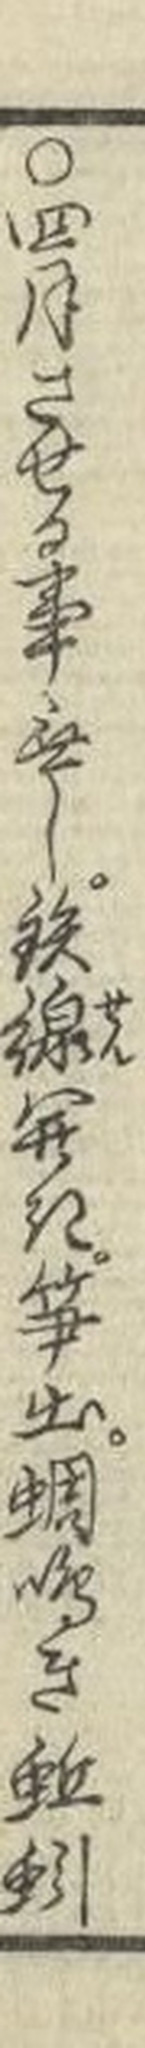○四月させる事無し。鉄線開き。笋出。蜩鳴き蚯蚓
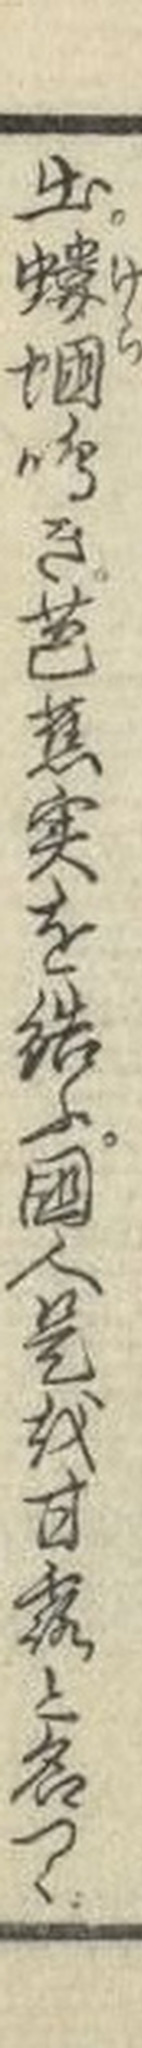出。蝼蟈鳴き。芭蕉実を結ふ。国人是を甘露と名つく。
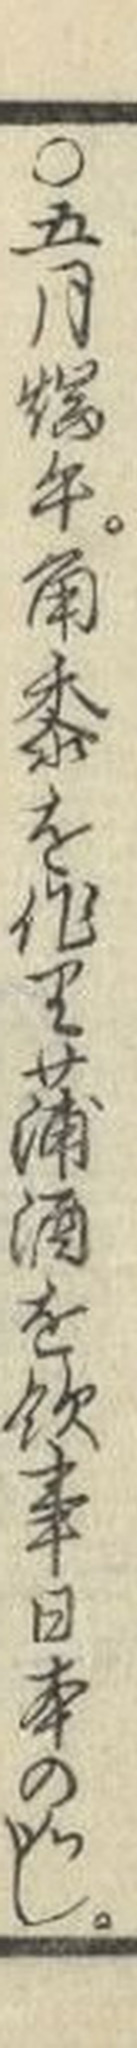○五月端午。角黍を作り蒲酒を飲事日本の如し。
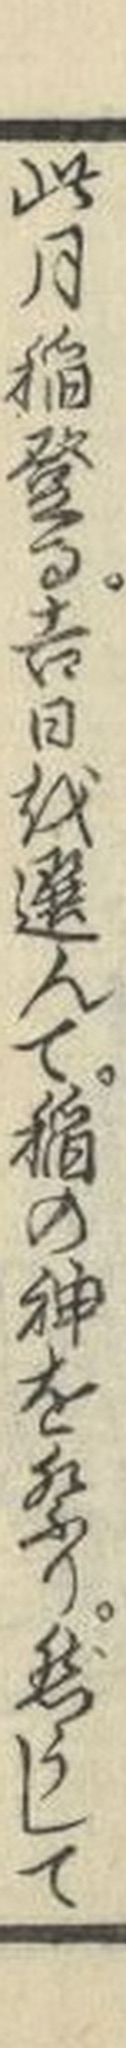此月稲登る。吉日を選んて。稲の神を祭り。然うして
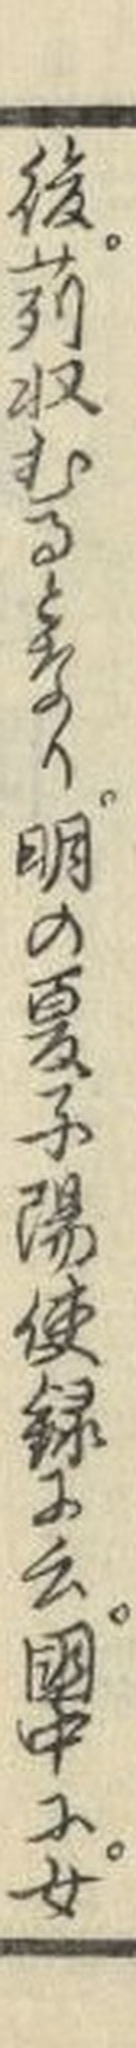後。苅収むるとなり。明の夏子陽使録に云。国中に。女
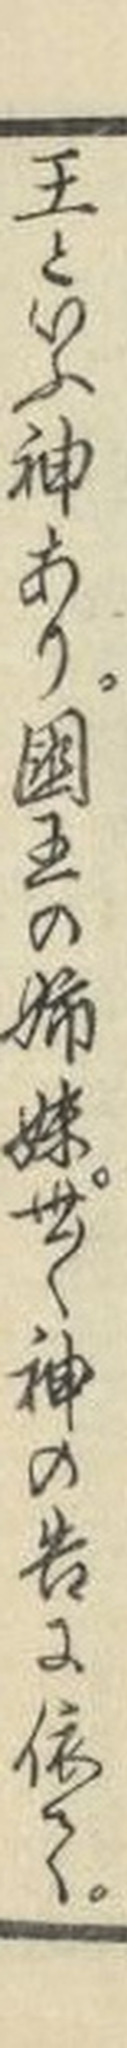王といふ神あり。国王の姉妹。世〳〵神の告に依て。
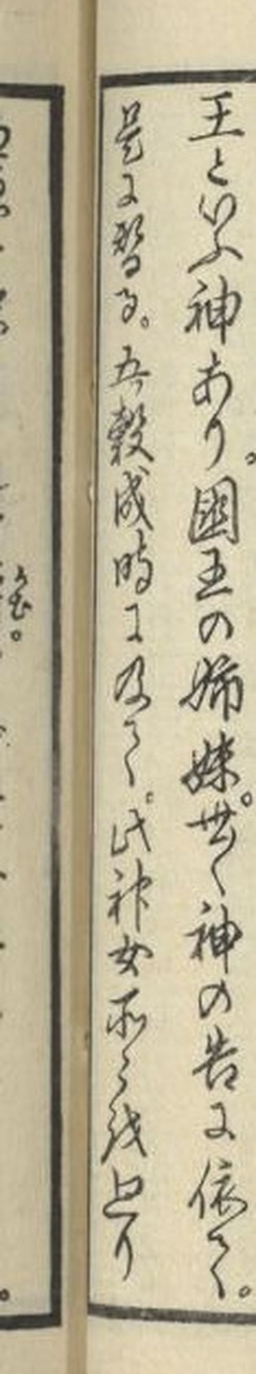是に替る。五穀成時に及て。此神女所々を廻り
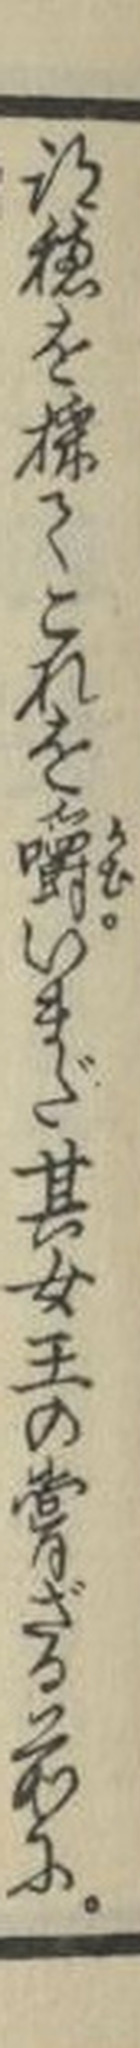行穂を採てこれを嚼。いまだ其女王の嘗ざる前に。
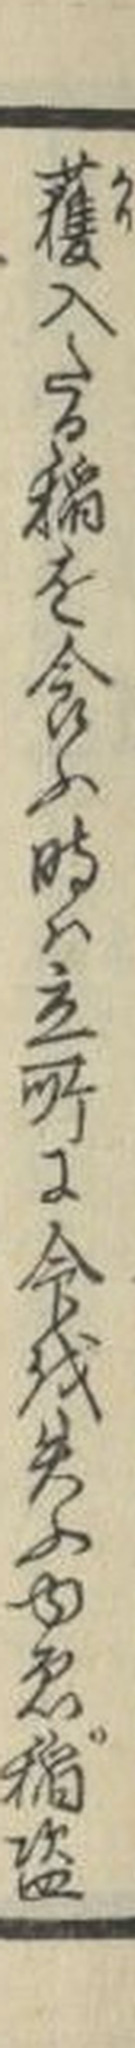獲入たる稲を食ふ時は立所に命を失ふゆゑ。稲盗
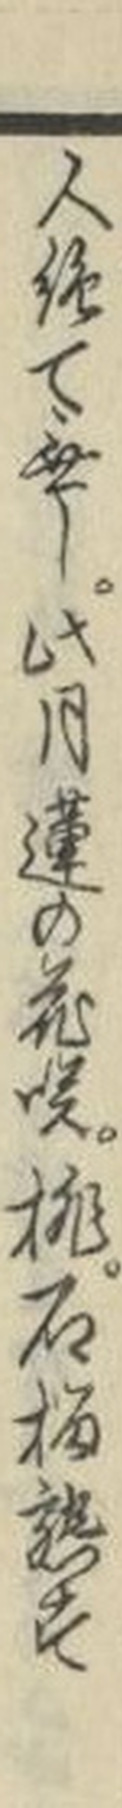人絶て無し。此月蓮の花咲。桃。石榴熟す。
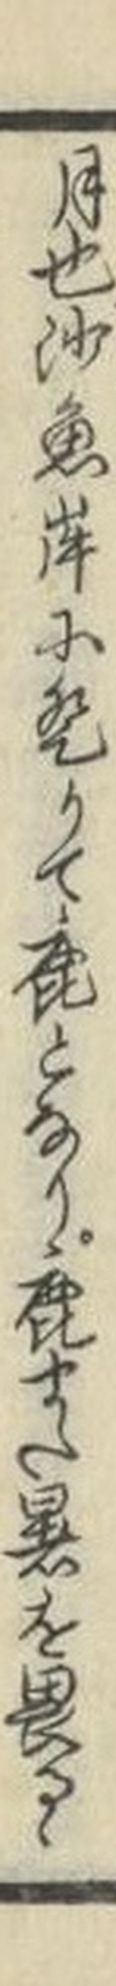月也。沙魚。岸に登りて鹿となり。鹿また暑を畏るゝ
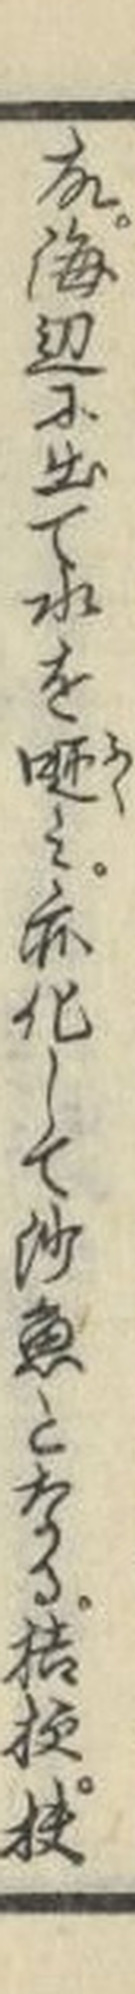故。海辺に出て水を咂み。亦化して沙魚となる。桔梗。扶
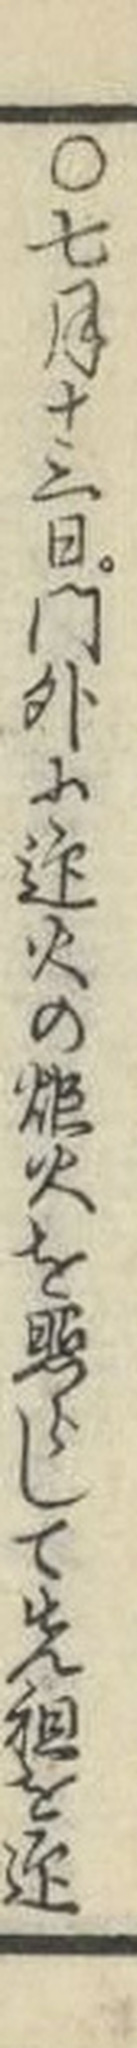○七月十三日。門外に迎火の炬火を照らして先祖を迎
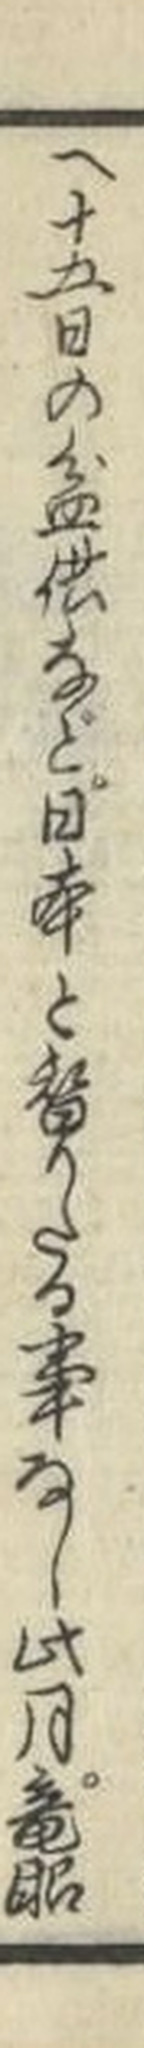へ十五日の盆供など。日本と替りたる事なし此月。竜眼
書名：琉球解語
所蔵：University of the Ryukyus Library
